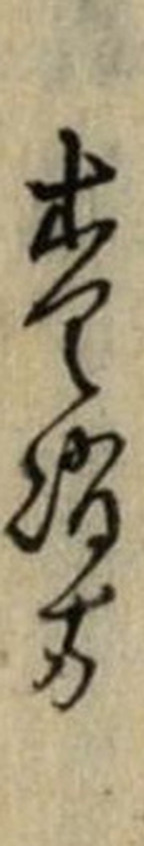木具賄方
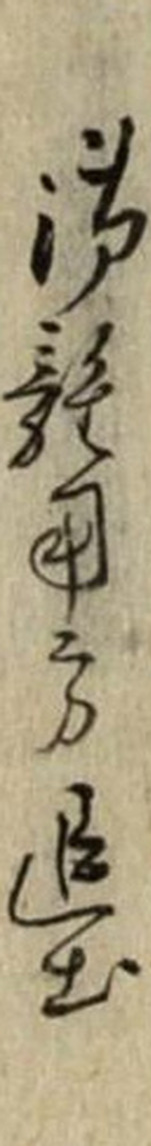御雑用方退出
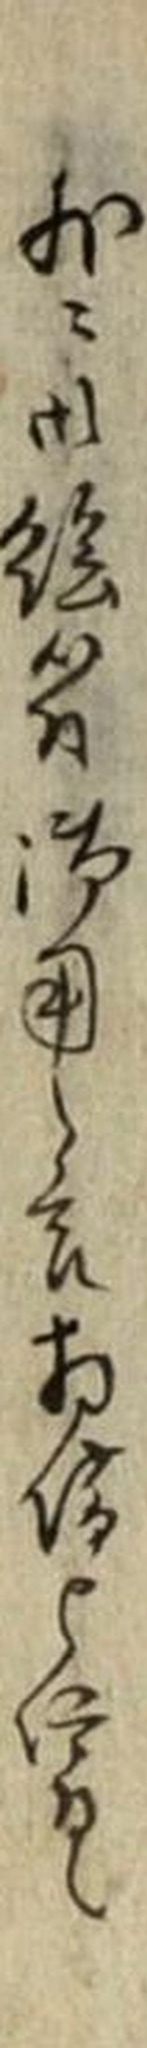外に御絵符御用之節拝借被仰付候
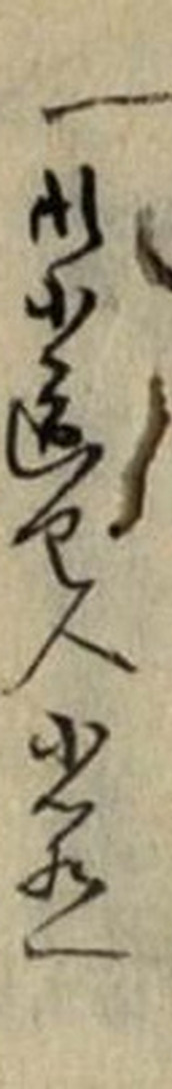御小道具入小箱一
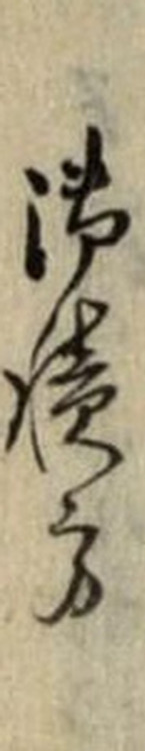御積方
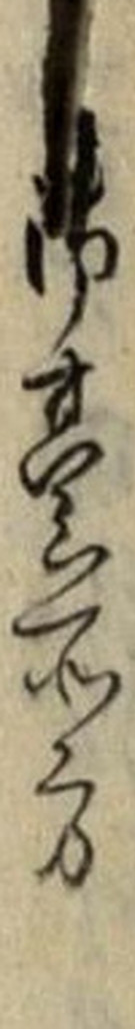御台所方
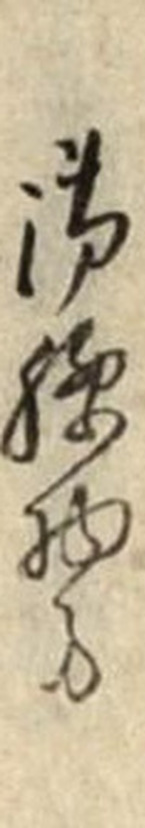御腰物方
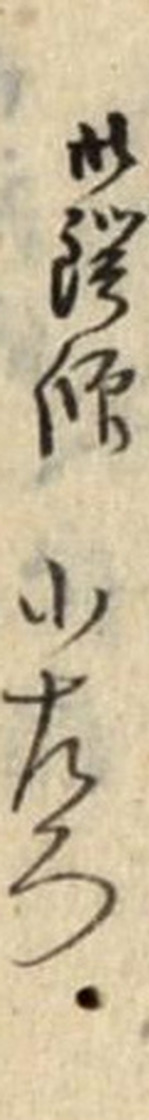提御鍔師小左衛門

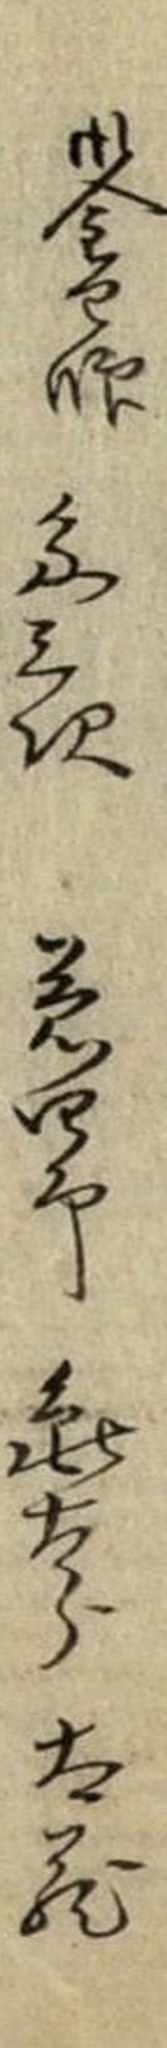風提御金具師多三次兼四郎亀太郎太蔵
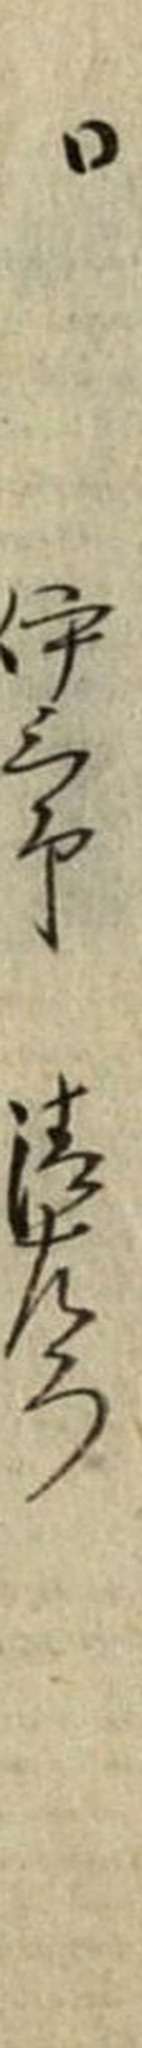提同伊三郎清左衛門
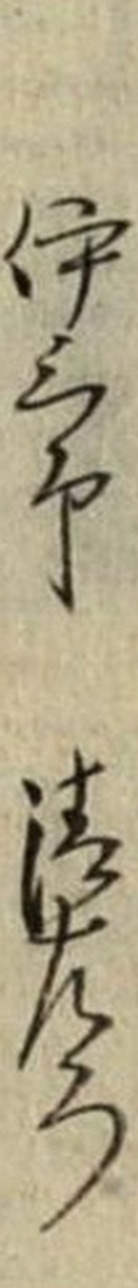提同伊三郎清左衛門
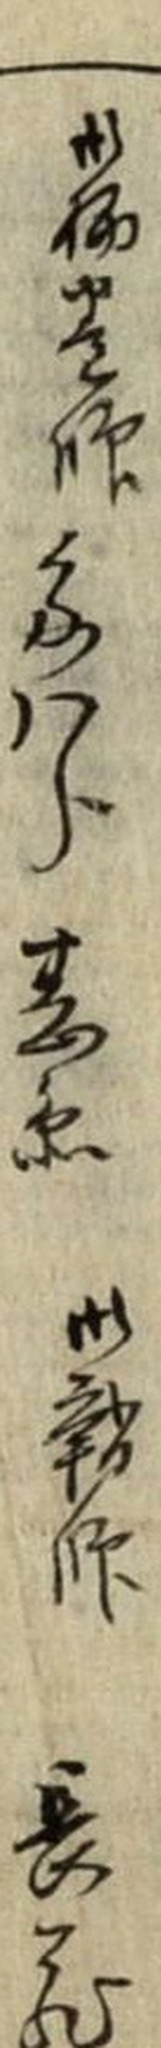風提御柄巻師多八郎甚兵衛御鞘師長蔵
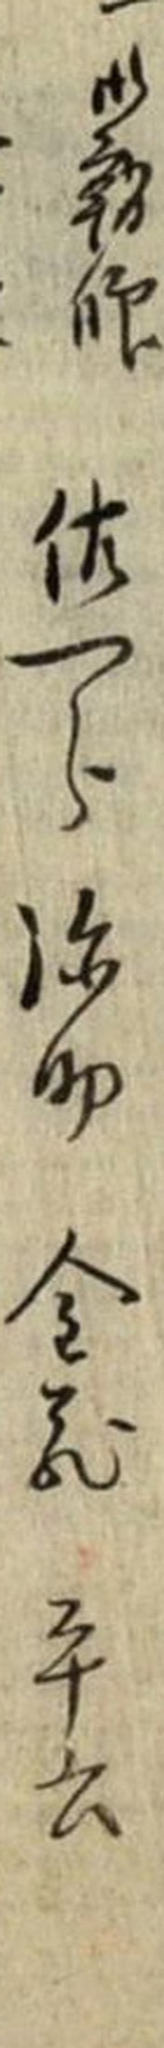御鞘師佐一郎弥助金蔵平六
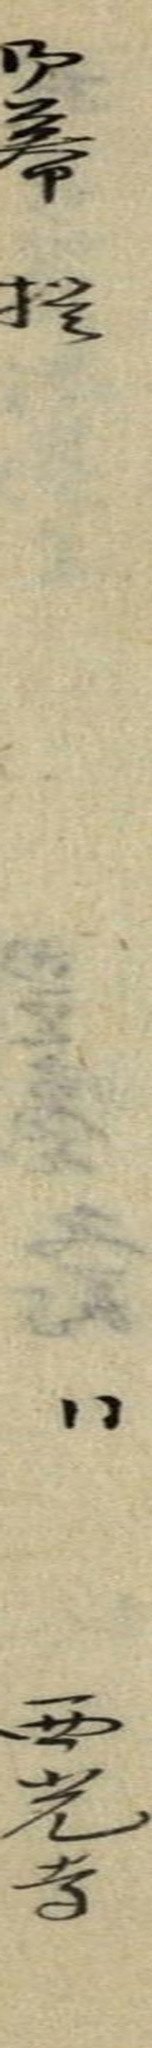御幕提同西光寺
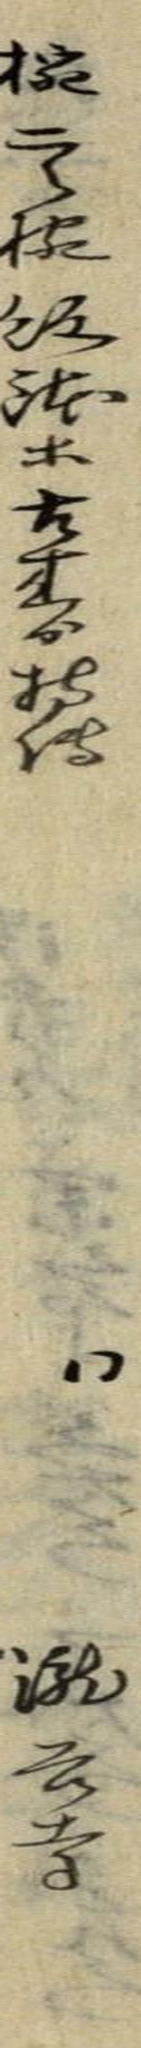椀二之椀飯鉢等古来ゟ持伝同瀧谷寺
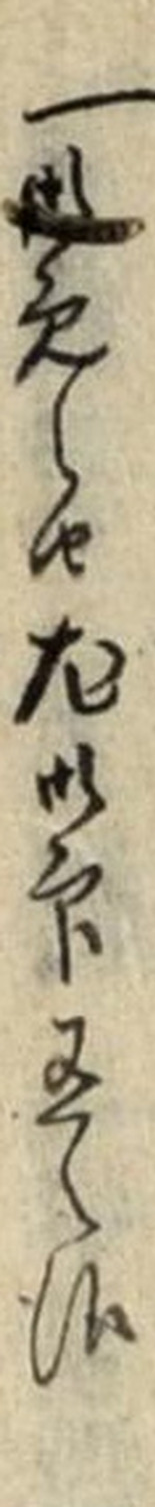御免之由尤御印有之趣
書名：蒐輯之部
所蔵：福井県文書館 Fukui Prefectural Archives
